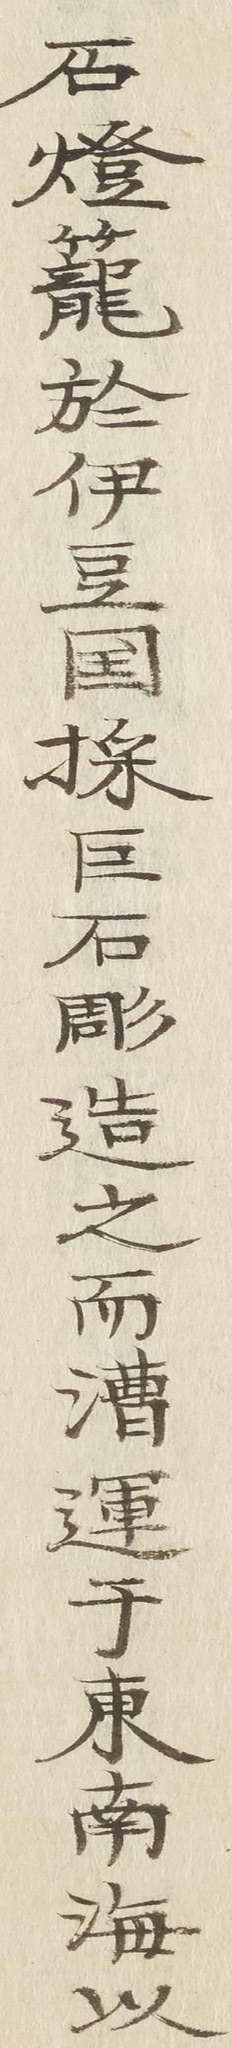石燈籠於伊豆国採巨石彫造之而漕運于東南海以
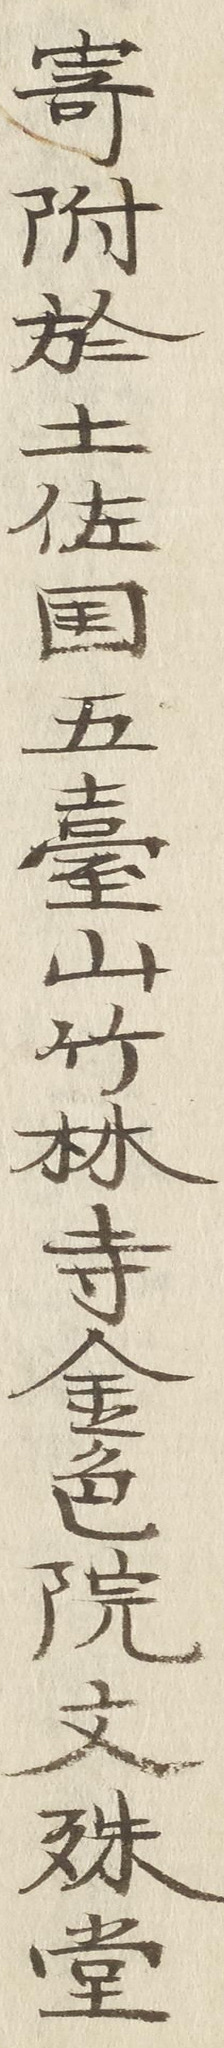寄附於土佐国五台山竹林寺金色院文殊堂
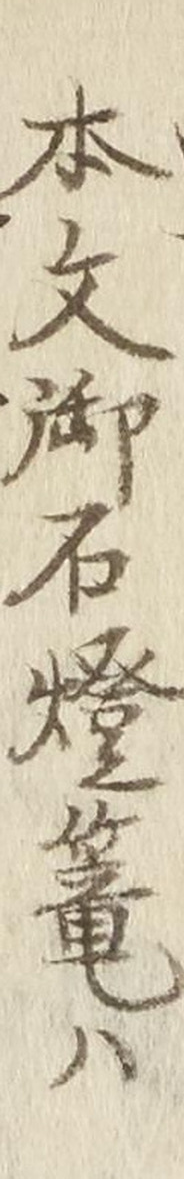本文御石燈籠は
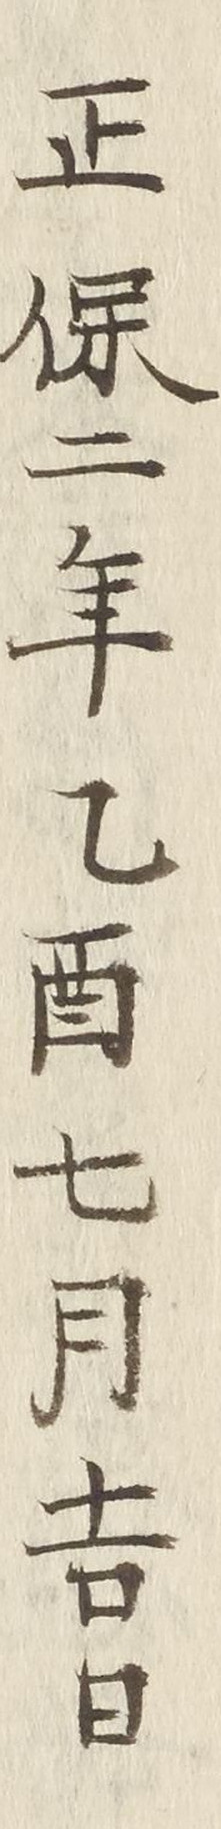正保二年乙酉七月吉日
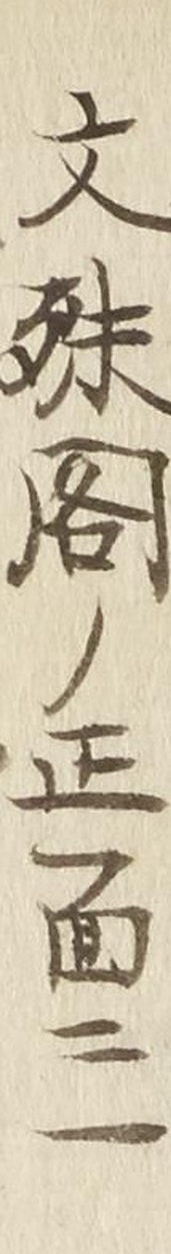文殊閣の正面に一
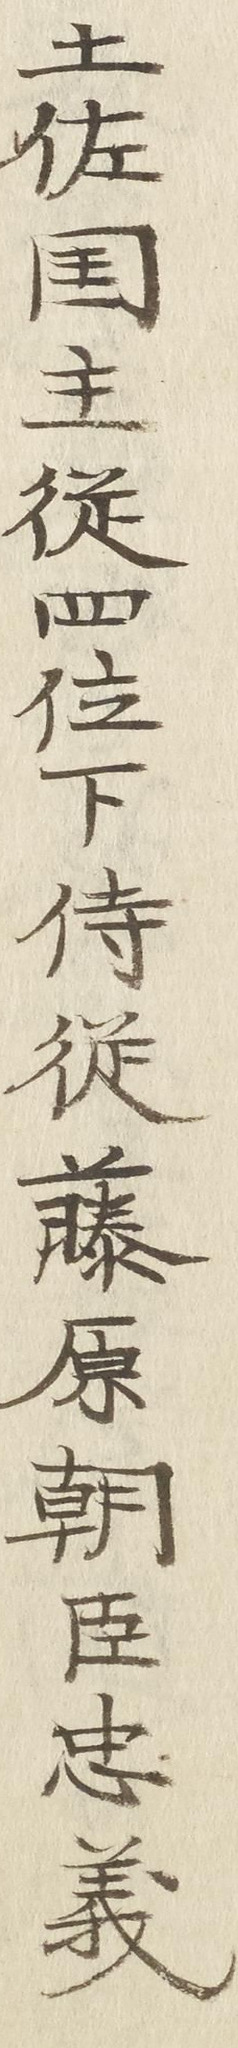土佐国主従四位下侍従藤原朝臣忠義
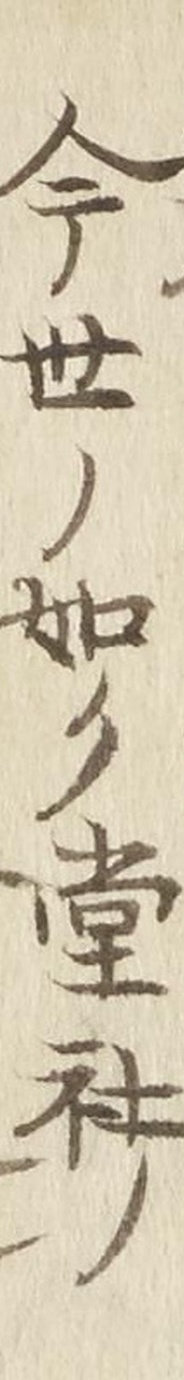今世の如く堂社の
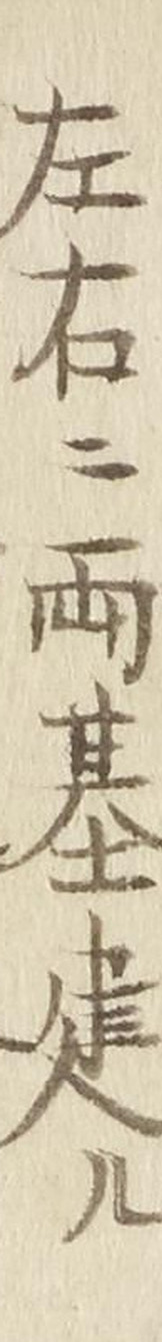左右に両基建る
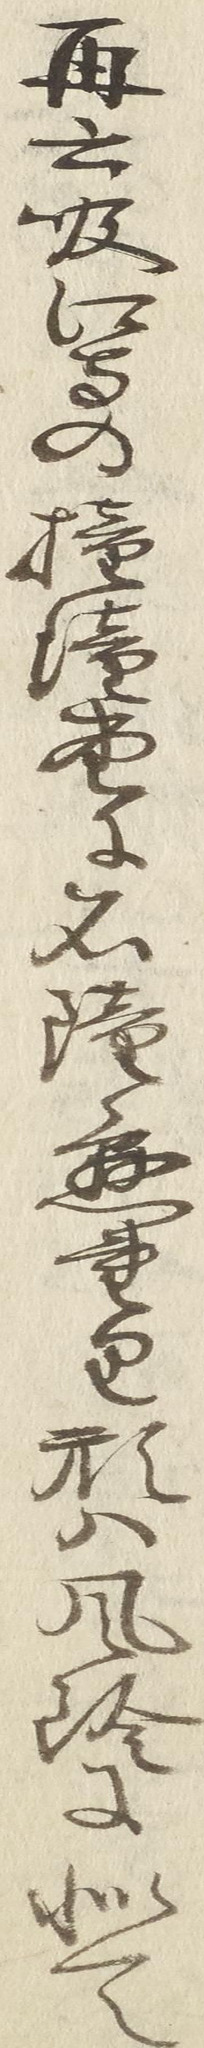再云吸江寺の撞鐘堂に名鐘懸れり形は風鈴に似て
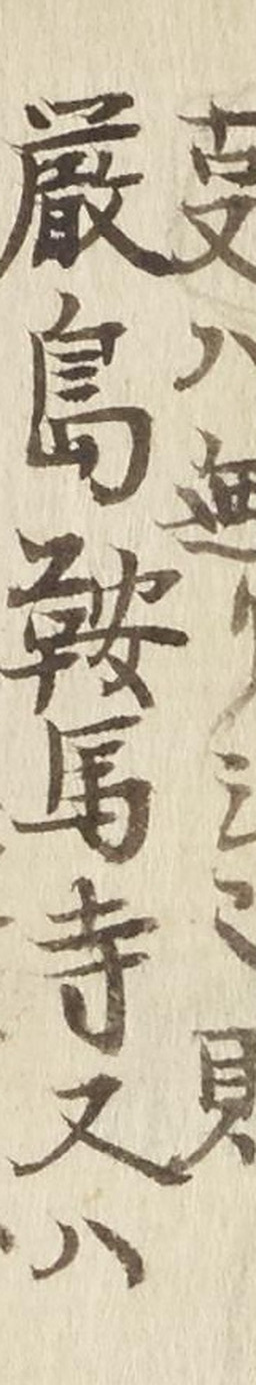厳島鞍馬寺又は
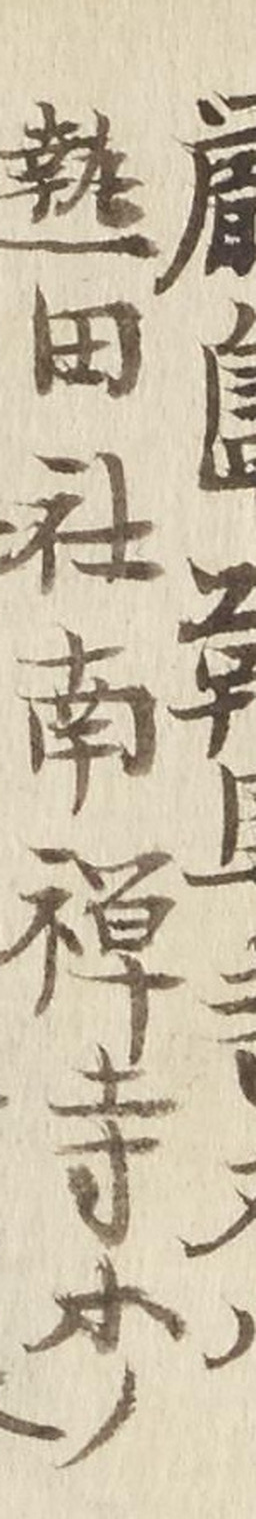熱田社南禅寺等の
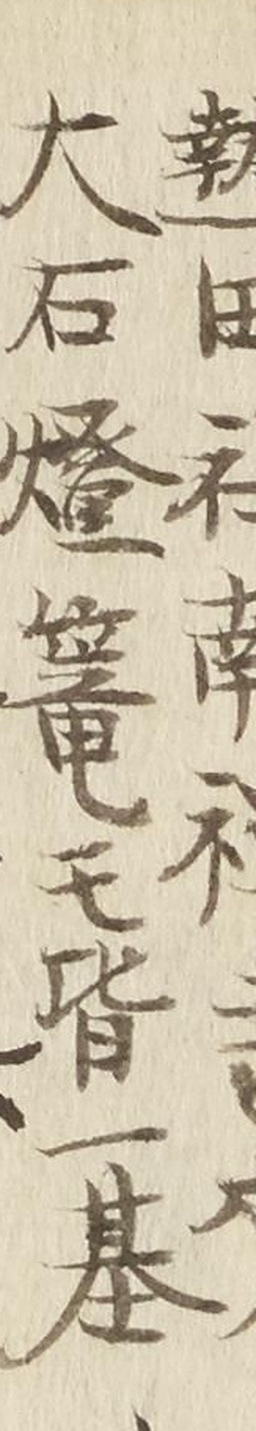大石燈籠も皆一基
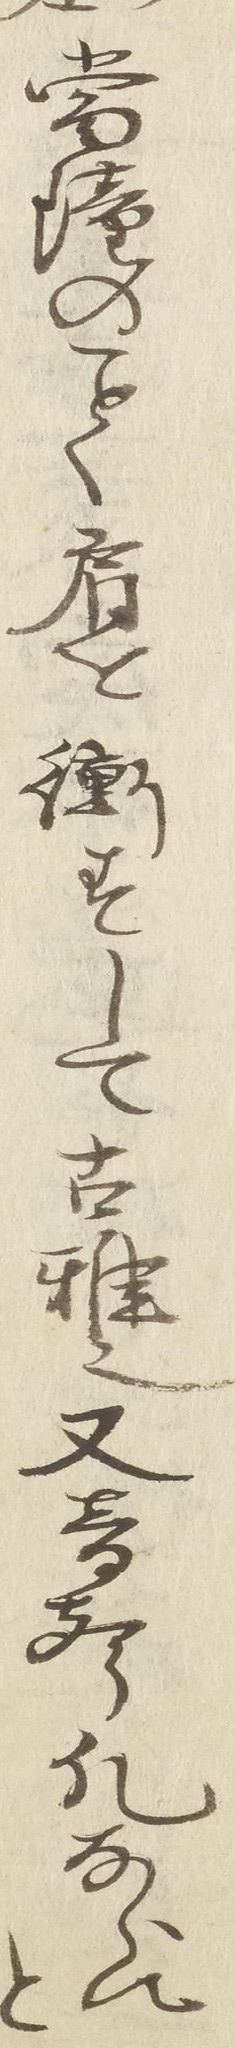常鐘のことく肩を衝すして古雅也又音声凡ならんと
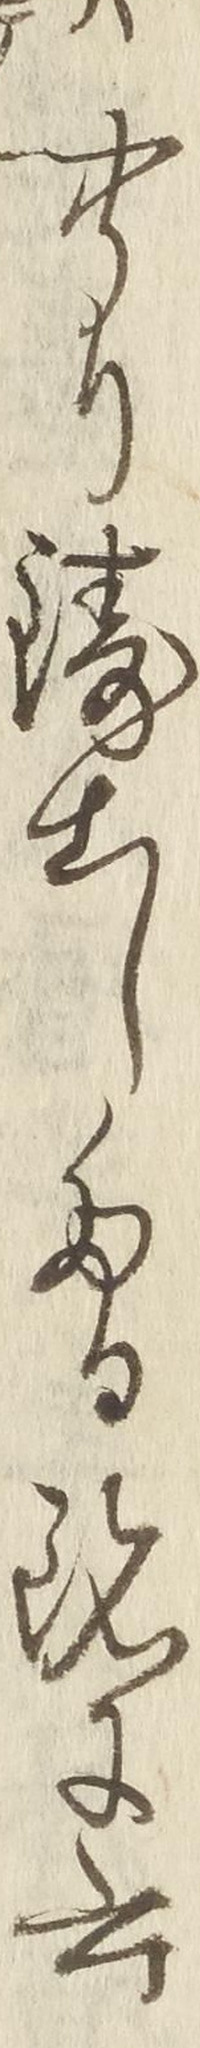聞り鋳出したる銘に云
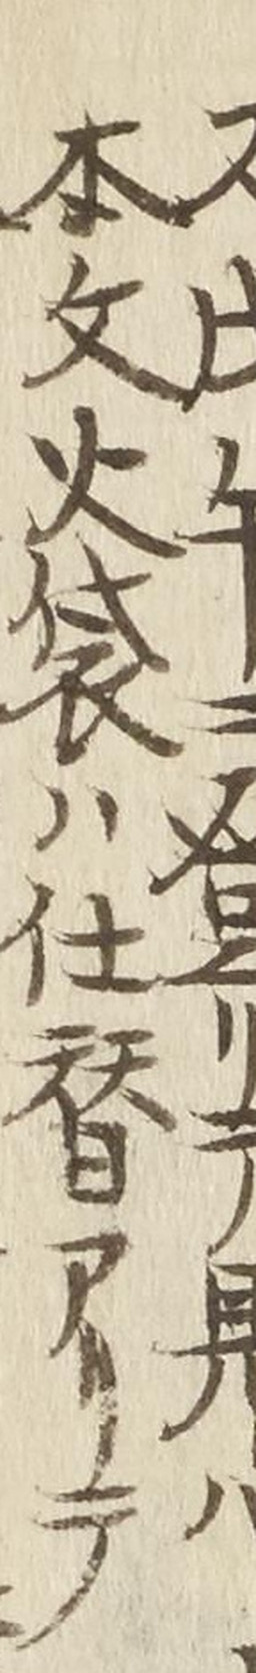本文火袋は仕替ありて

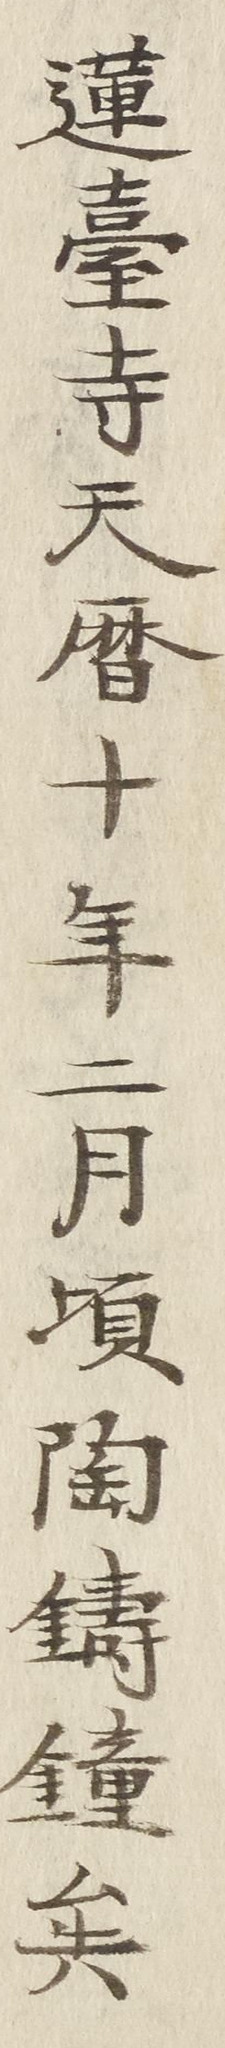蓮台寺天暦十年二月頃陶鋳鐘矣
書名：地震記　上
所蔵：東京大学地震研究所図書室 Earthquake Research Institute Library, The University of Tokyo, JAPAN
